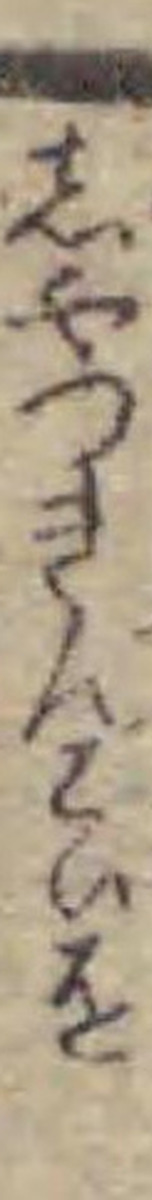しやつきんこいを
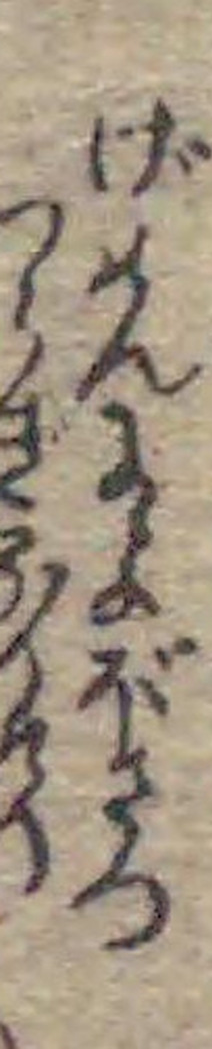げめんによぼさつ
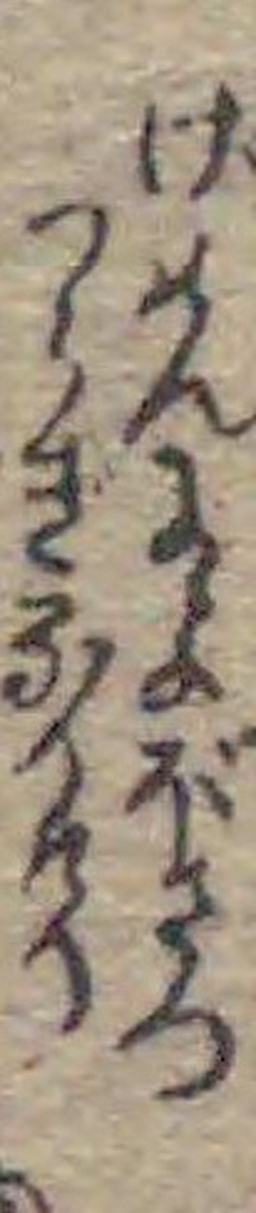つらきなりけり
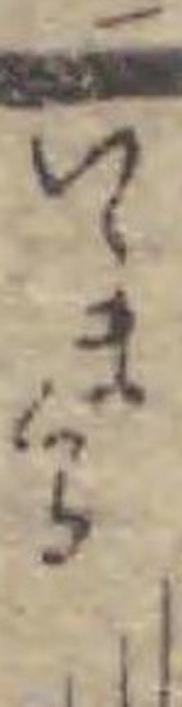いゝまくる
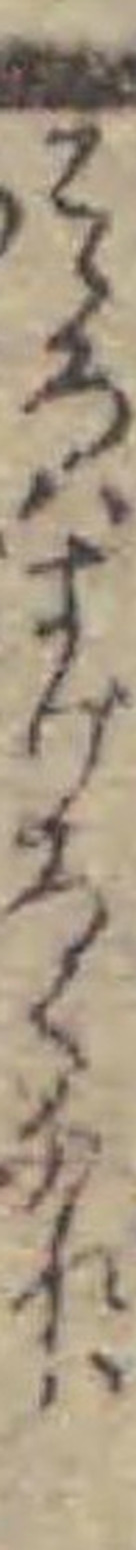こゝろはすけろくなれは
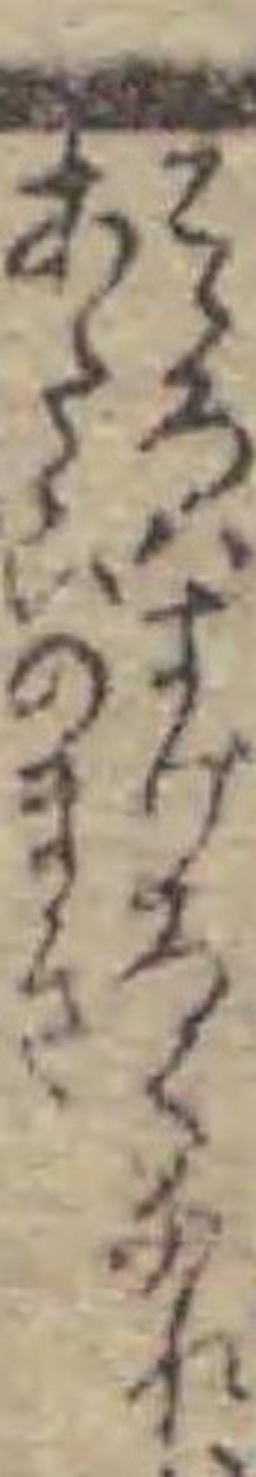あたゝいのまき
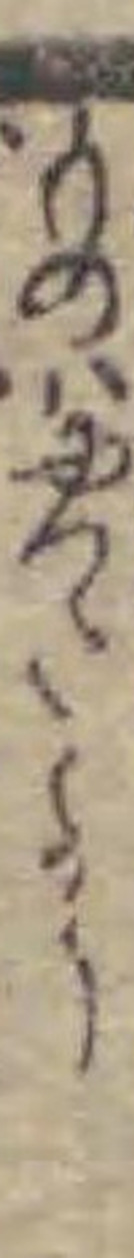ものはやつたよう
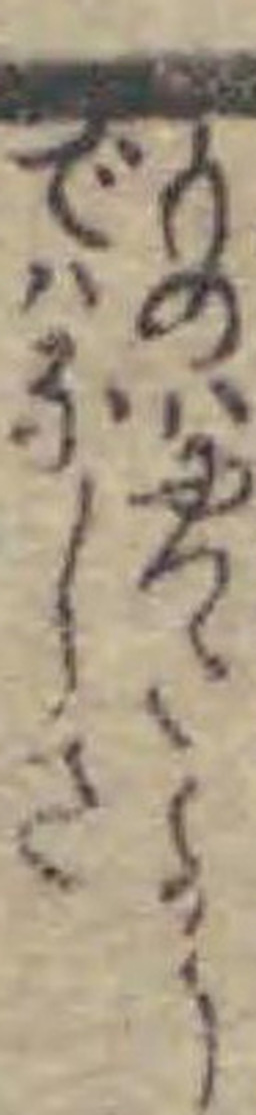ではなしさ
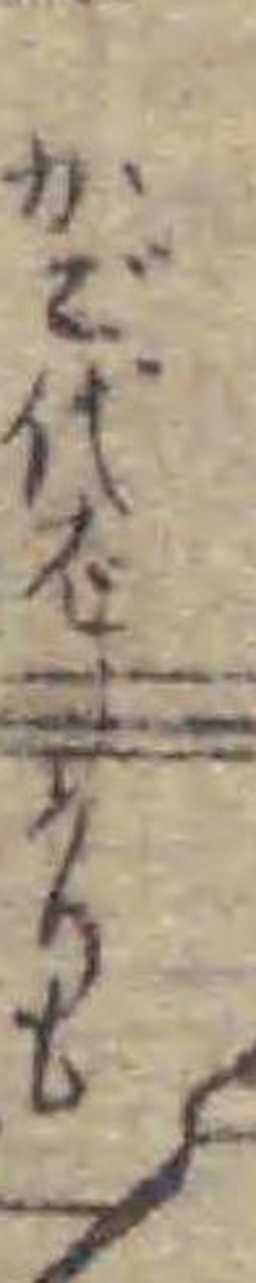かご代ばかりも
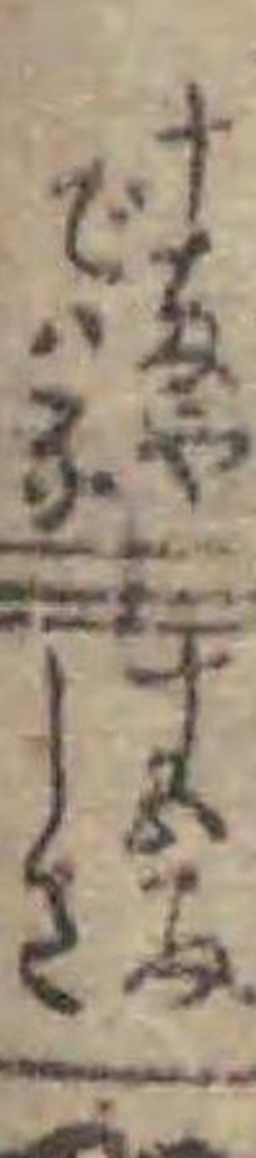ではなしさ
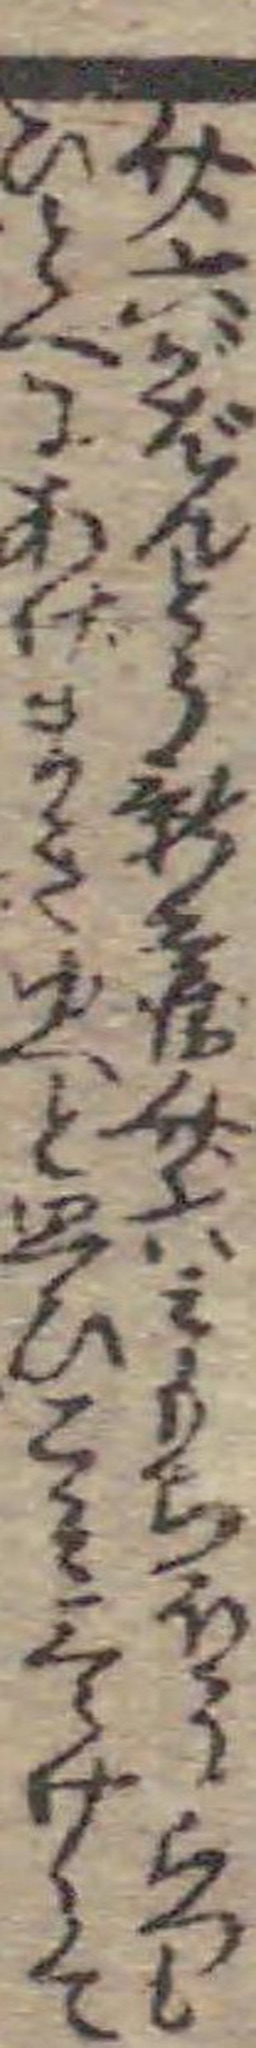ひとへにあげまきゆへと思ひこみみうけして
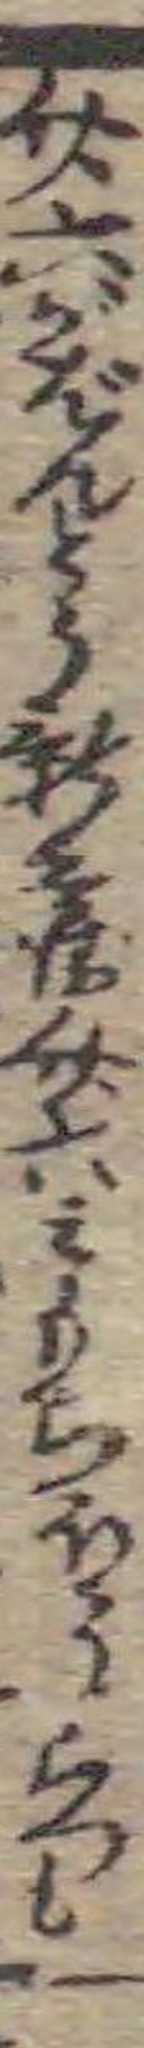介六はばんとう新兵衛介六みもちほうらつも
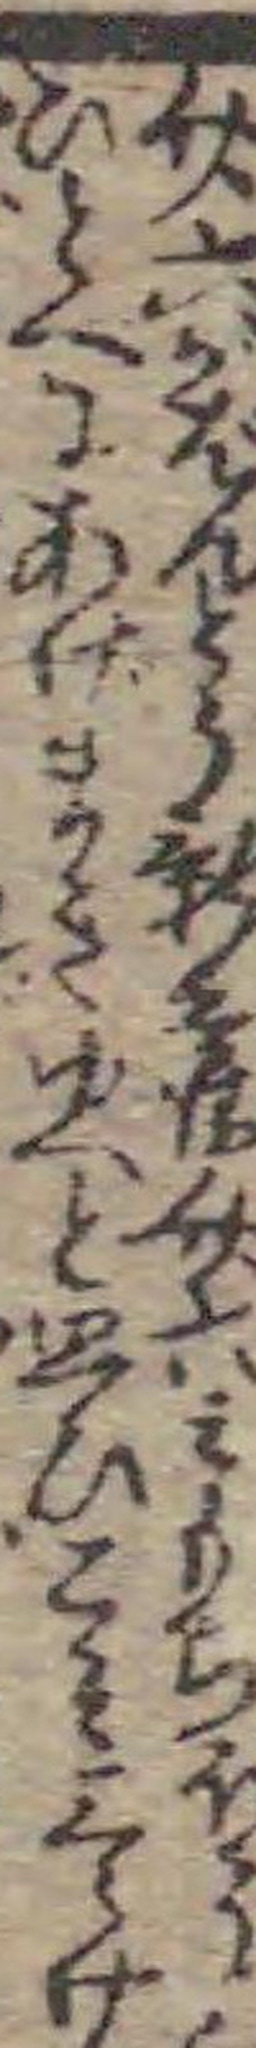ひとへにあげまきゆへと思ひこみみうけして
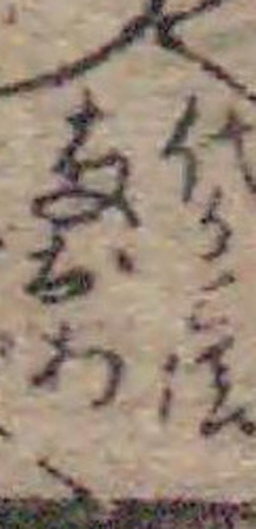両おわ
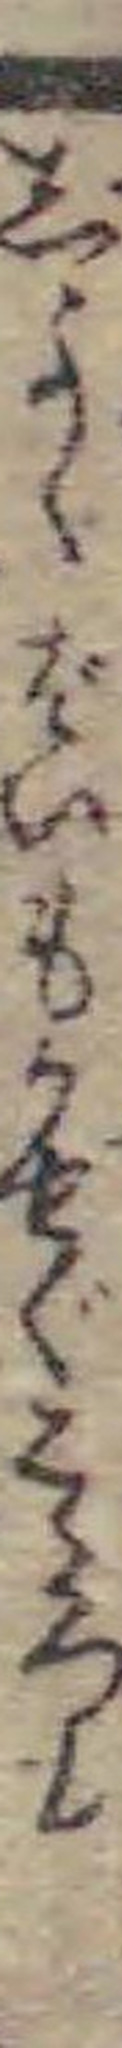しようばいもかせぐこゝろも
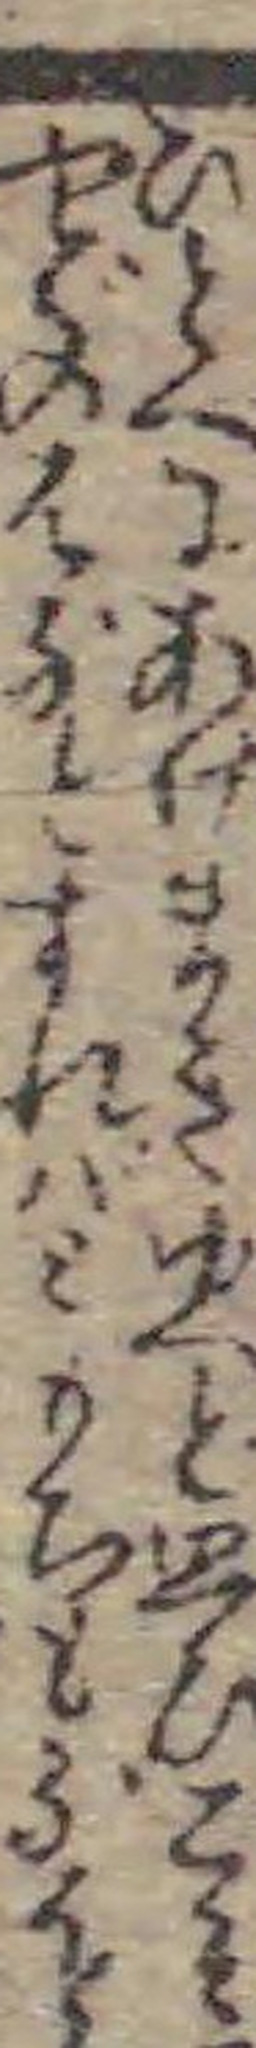やどのはなとすればみもちもなをる
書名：江戸花俳優贔屓 : 3巻
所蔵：国立国会図書館 National Diet Library, JAPAN
